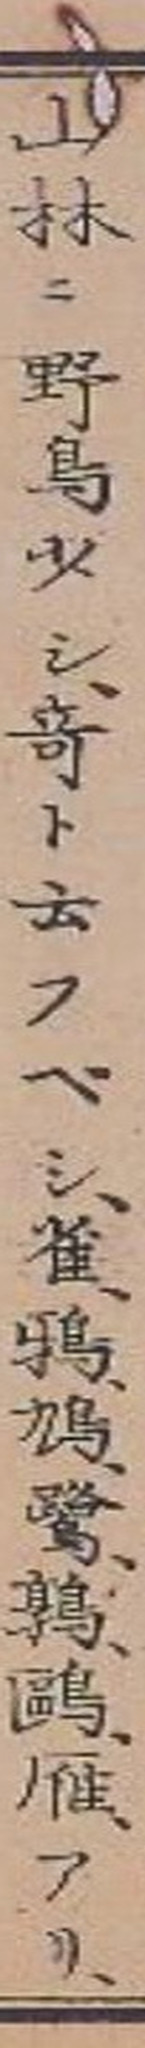山林ニ野鳥少シ、奇ト云フベシ、雀、鴉、鳩、鷺、鶉、鷗、雁、アリ、
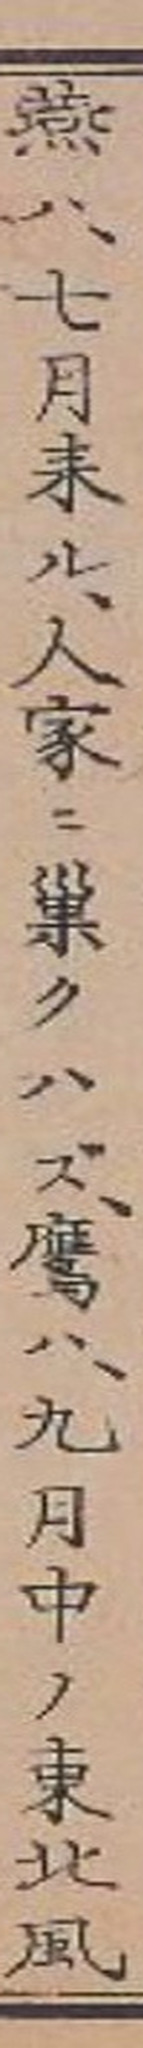燕ハ、七月来ル、人家ニ巣クハズ、鷹ハ、九月中ノ東北風
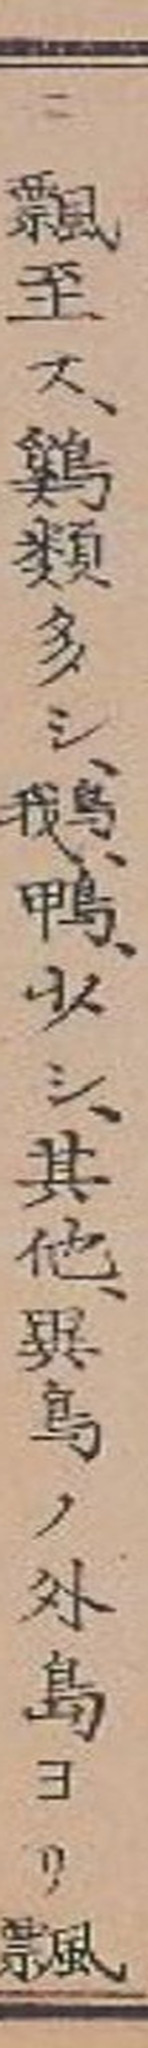ニ飄至ス、鶏類多シ、鵝、鴨、少シ、其他、異鳥ノ外島ヨリ飄
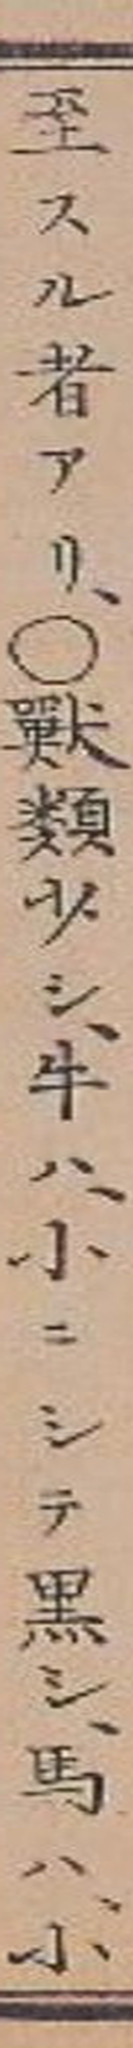至スル者アリ、○獣類少シ、牛ハ、小ニシテ黒シ、馬ハ、小
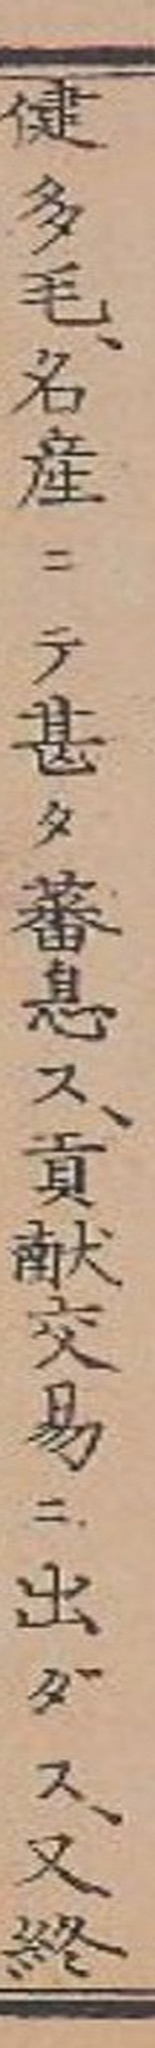健多毛、名産ニテ甚タ蕃息ス、貢献交易ニ出ダス、又終
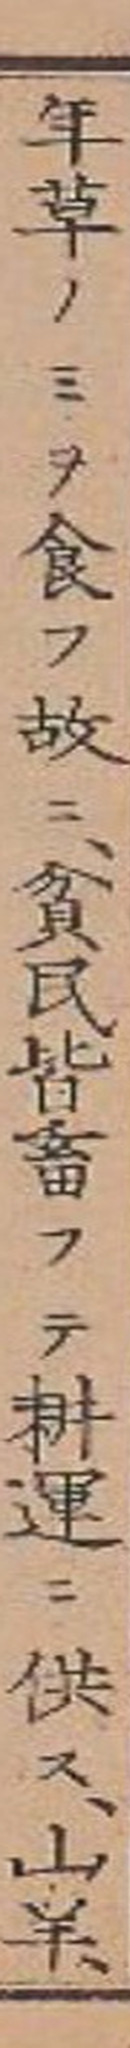年草ノミヲ食フ故ニ、貧民皆畜フテ耕運ニ供ス、山羊、
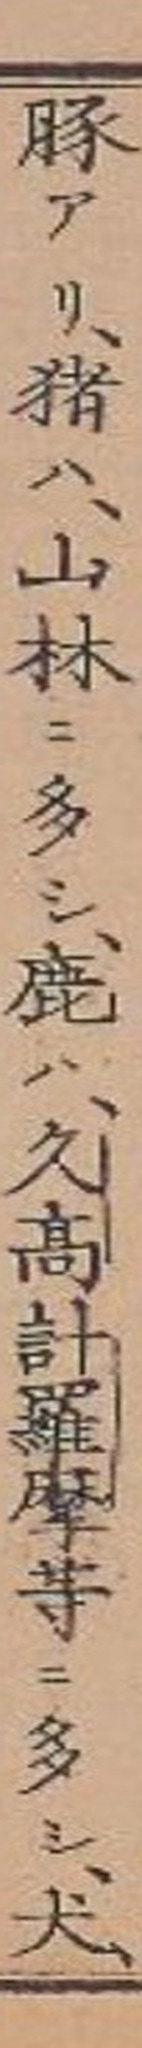豚アリ、猪ハ、山林ニ多シ、鹿ハ、久高計羅摩等ニ多シ、犬、
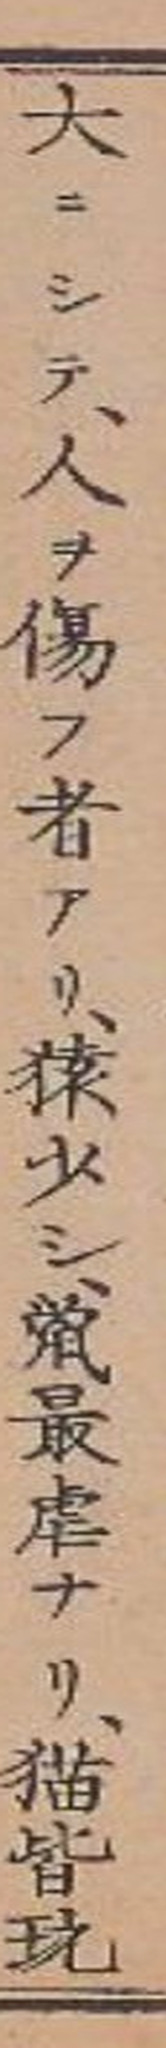大ニシテ、人ヲ傷フ者アリ、猿少シ、鼠最虐ナリ、猫皆玩
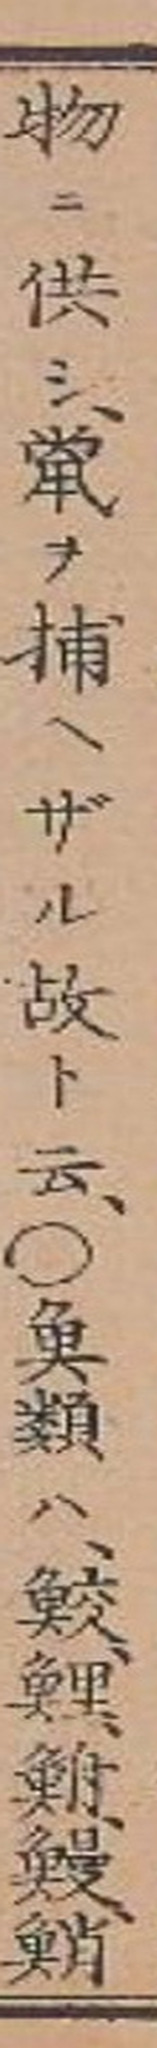物ニ供シ、鼠ヲ捕ヘザル故ト云、○魚類ハ、鮫、鯉、鮒、鰻、鮹
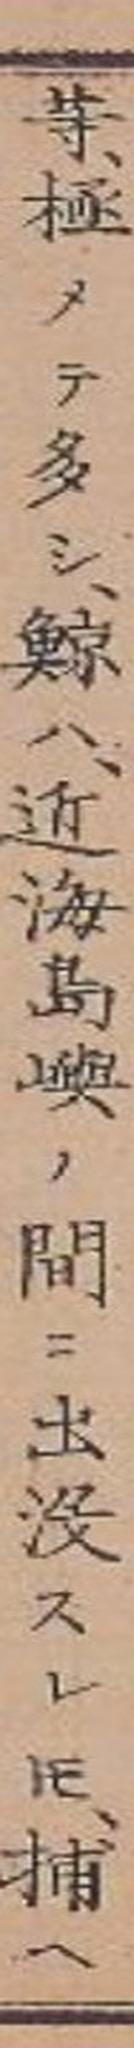等、極メテ多シ、鯨ハ、近海島嶼ノ間ニ出没スレトモ、捕ヘ
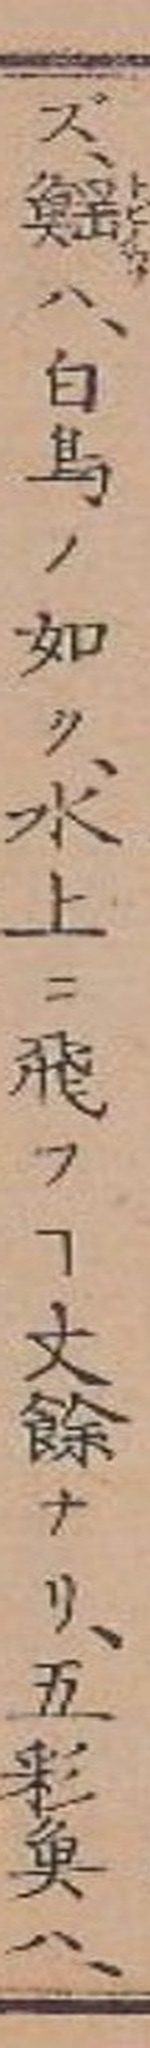ズ、鰩ハ、白鳥ノ如ク、水上ニ飛フヿ丈余ナリ、五彩魚ハ、
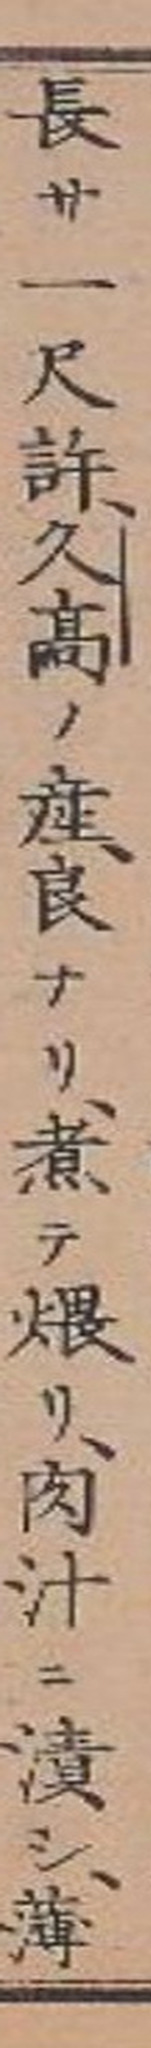長サ一尺許、久高ノ産、良ナリ、煮テ煨リ、肉汁ニ漬シ、薄
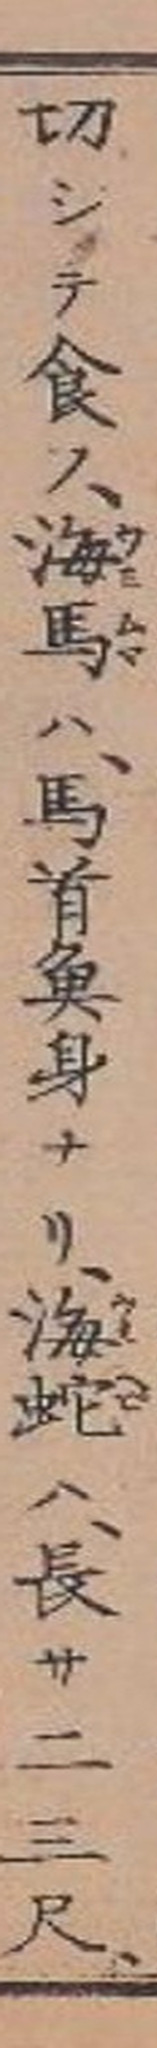切シテ食ノ、海馬ハ、馬首魚身ナリ、海蛇ハ、長サ二三尺、
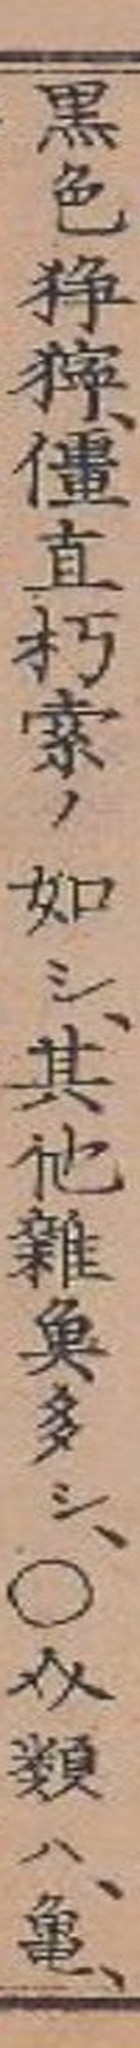黒色獰、僵直朽索ノ如シ、其他雑魚多シ、○介類ハ、亀、
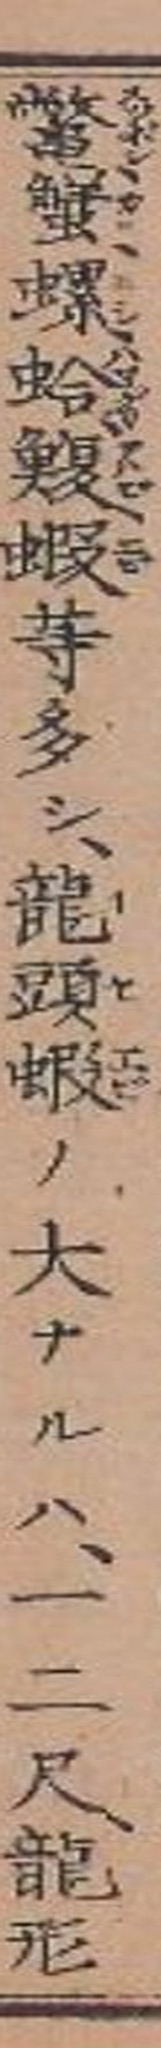鼈、蟹、螺、蛤、鰒、蝦等多シ、竜頭蝦ノ大ナルハ、一二尺、竜形

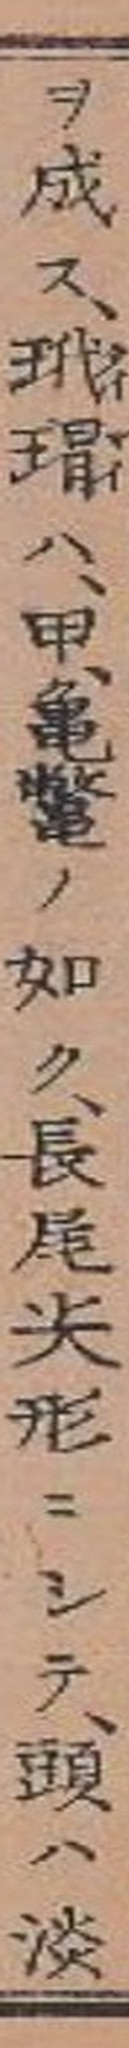ヲ成ス、玳瑁ハ、甲、亀鼈ノ如ク、長尾尖形ニシテ、頭ハ淡
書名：琉球新誌 巻上
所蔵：University of the Ryukyus Library
